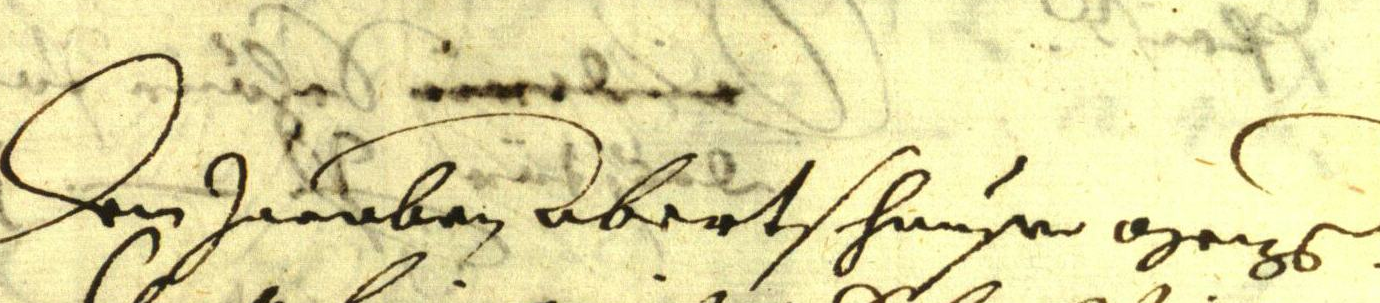Den Jacoben Abertshaūser Mezg¬
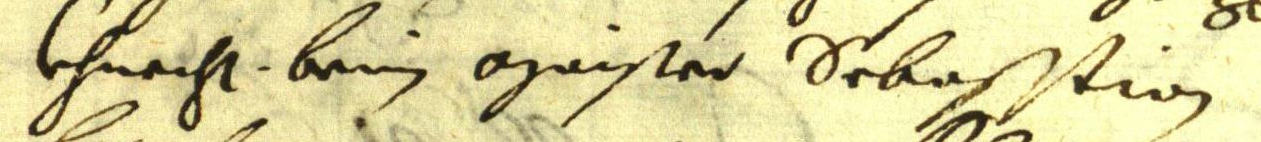khnecht. beim Maister Sebastian
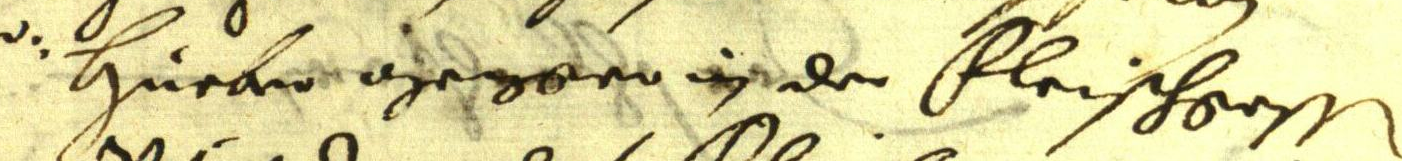Hūeber Mezger in der Fleischgass
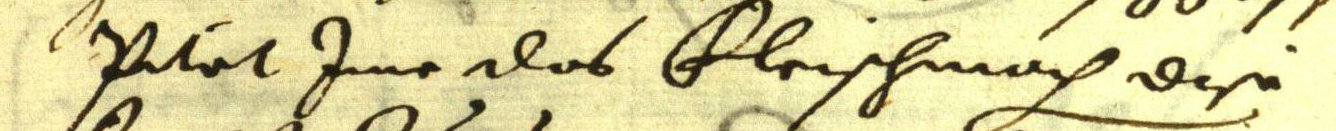Pitet Ime das Fleischmach dise
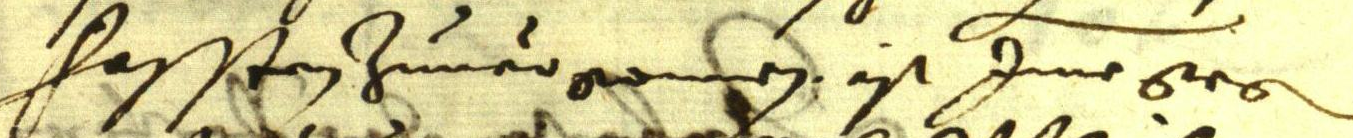Fassten Zūuērgonnen. ist Ime geg
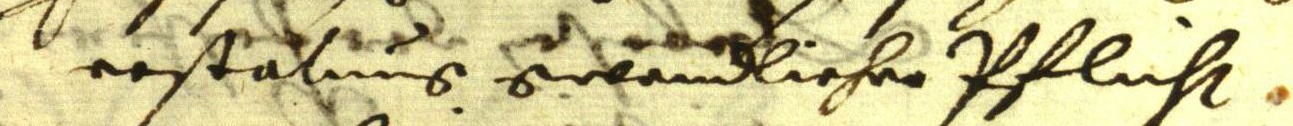erstatūng gwendliche Pflicht
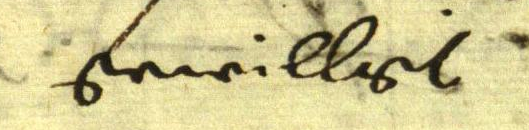gewilligt.
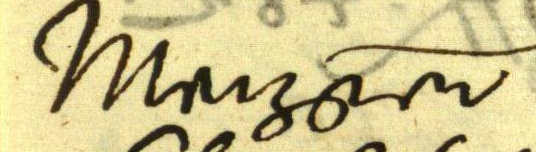Mezger
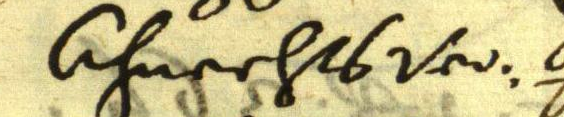Khnechts Ver¬
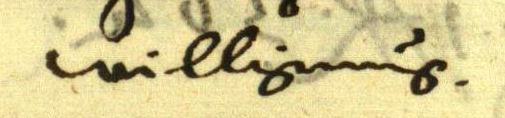willigūng.
